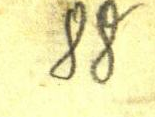88
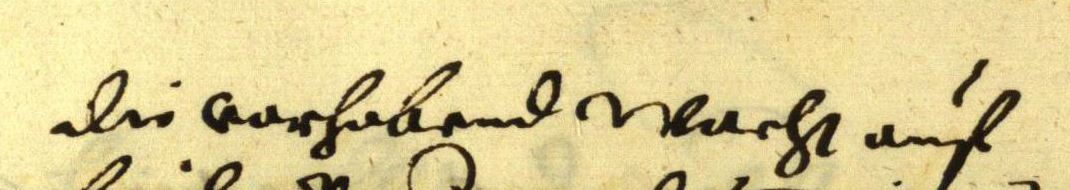die vorhabend Wacht aūf
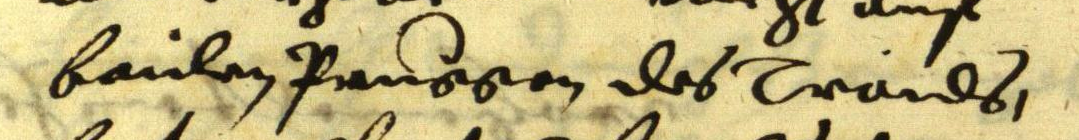baiden Prūggen des Traids,
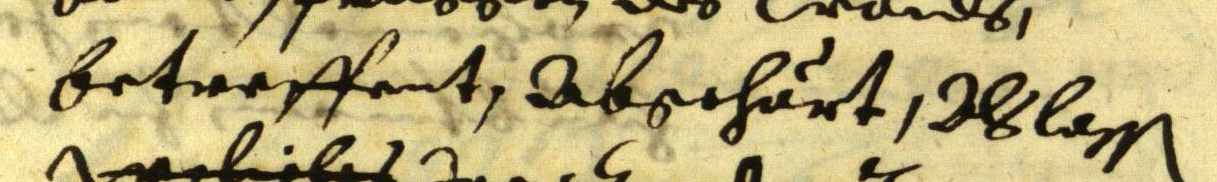betreffent, Abgehōrt, Als lass
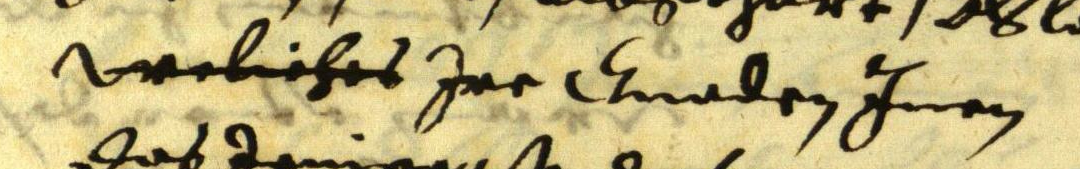weliches Ire Gnaden Inen
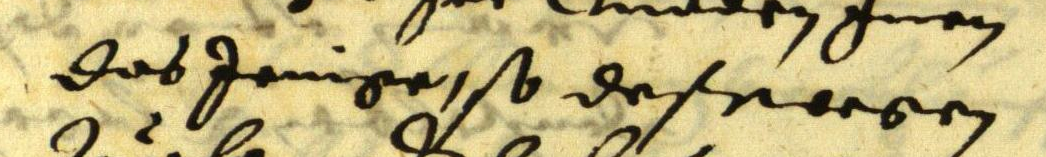das Jenige, so deßwegen
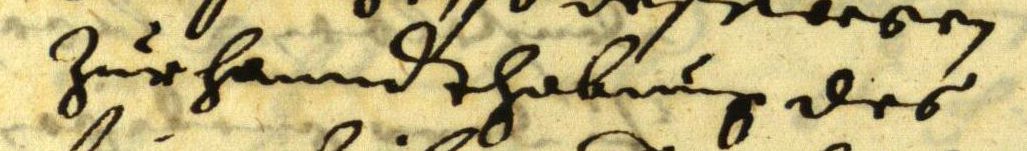Zūr hanndthabūng des
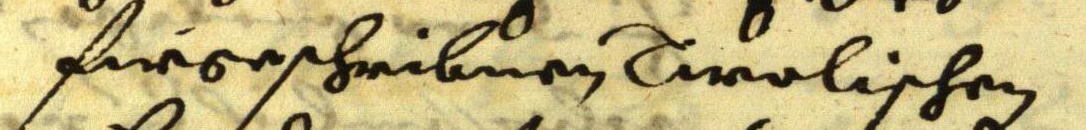firgeschribnen Tirolischen
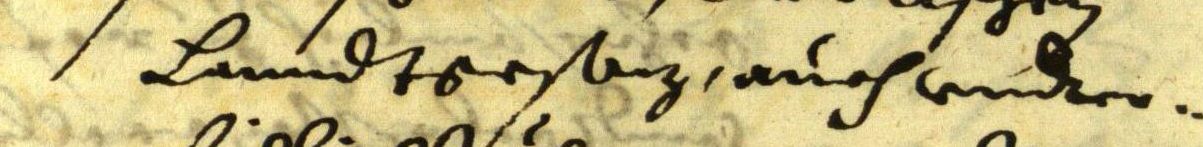Landtgesez, aūch vndter¬
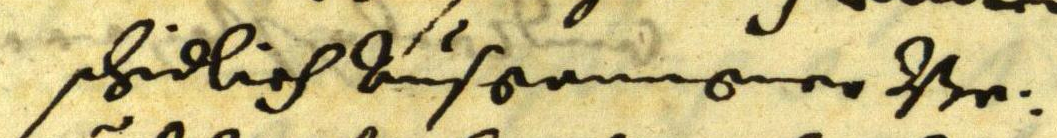schidlich Aūsganngner Be¬
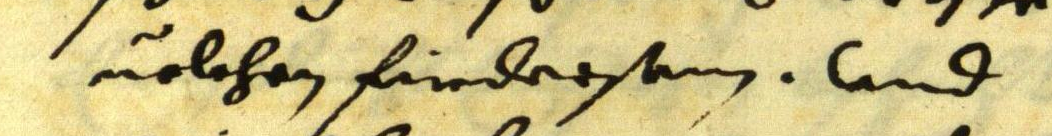ūelchen firdersam. vnd
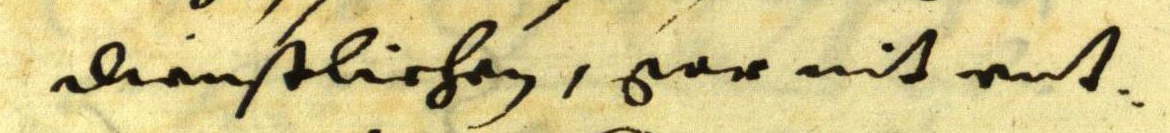dienstlichen, gar nit ent¬
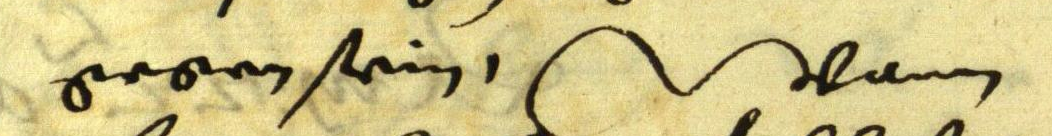gegen sein, Wann
